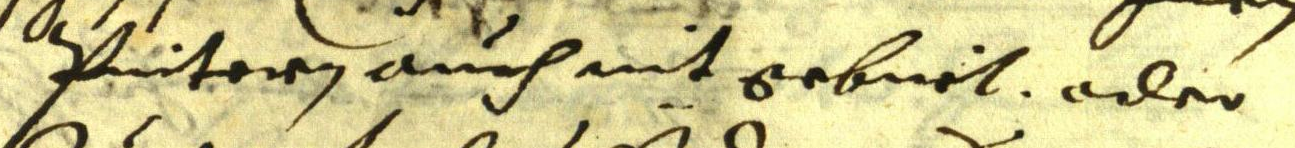Pintern aūch nit gebiet. oder
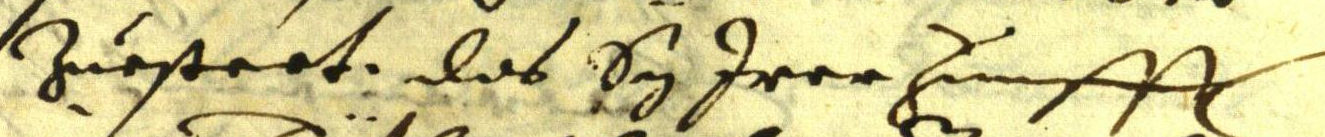Zūesteet. das Sÿ Irer Zūnfft
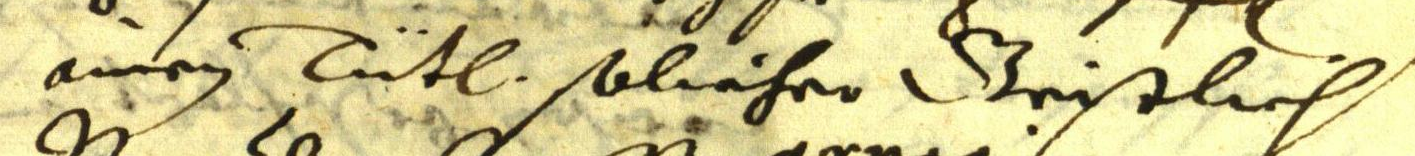ainen Tütl. solicher Geistlich
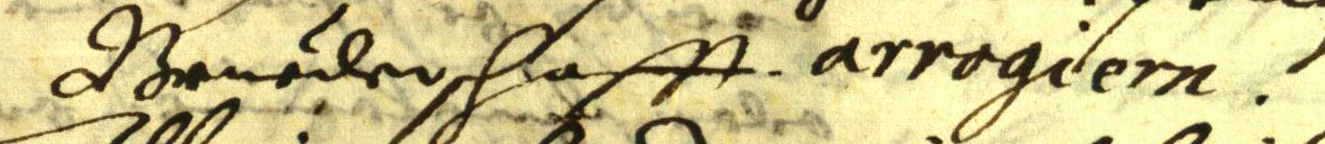Brūederschafft. arrogiern.
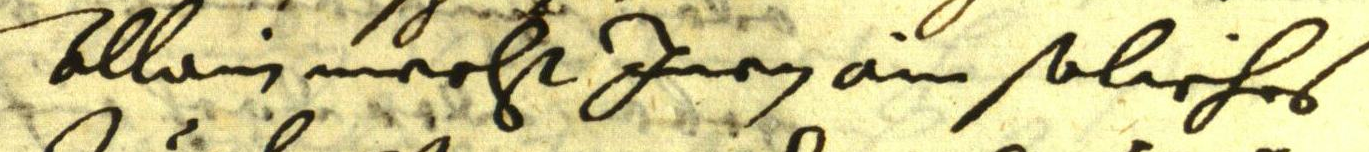Allain mecht Inen ain soliches
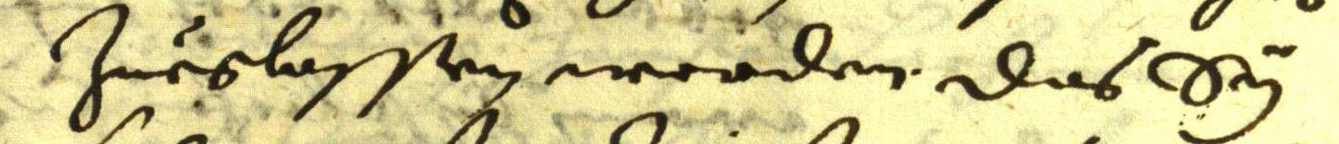Zūeglassen werden. das Sÿ
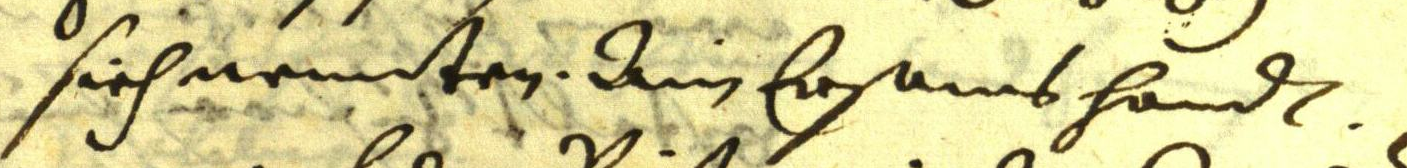sich nemten. Ain Ersams handt¬
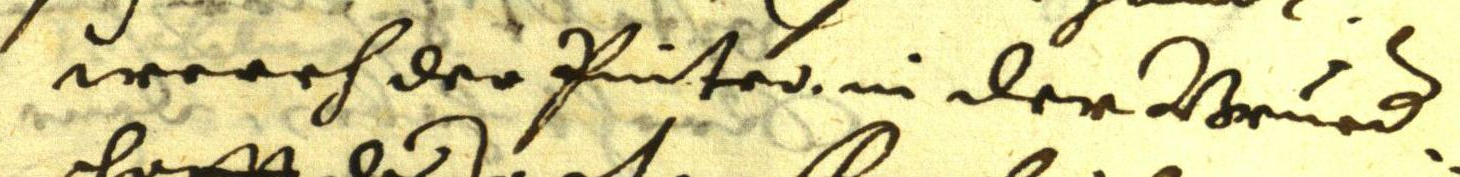werch der Pinter. in der Brūed¬
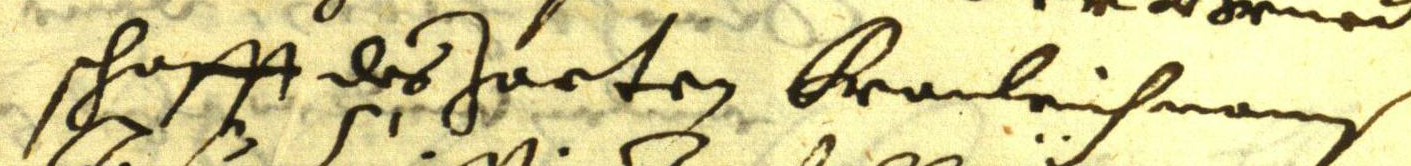schafft des Zarten Fronleichnams
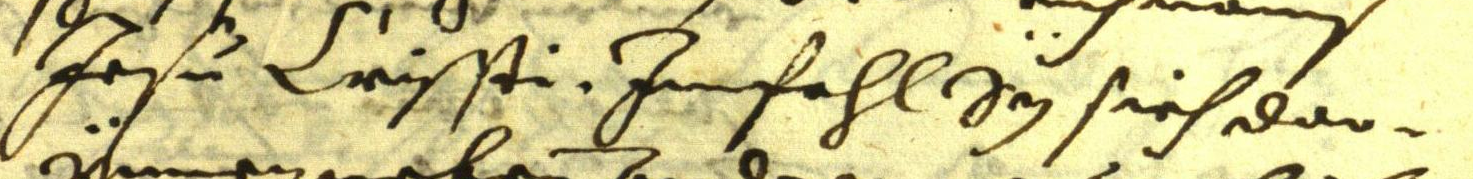Jesū Crissti. Innfahl Sÿ sich dar¬
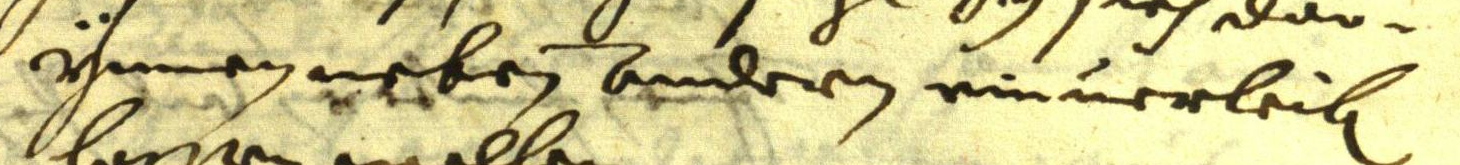ÿnnen neben Andern einūerleib
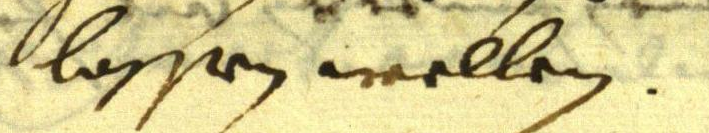lassen wellen.
